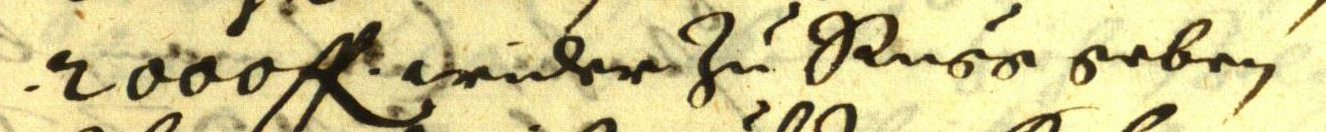2000 fl. wider Zū Rūgg geben
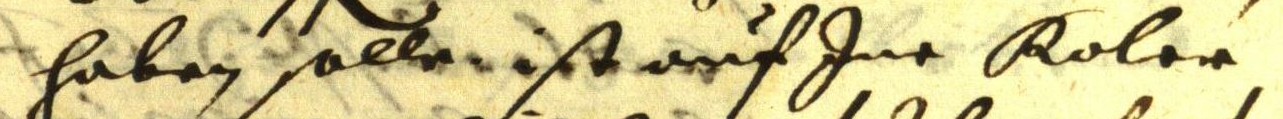haben solle. ist aūf Ine Koler
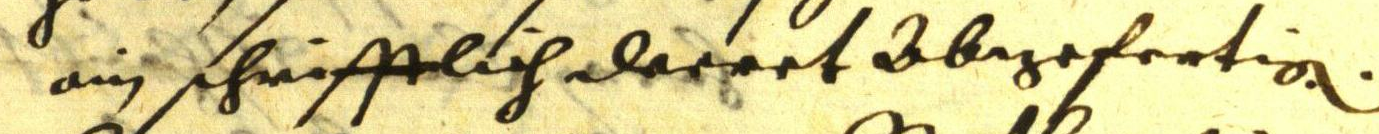ain schrifftlich decret Abzefertig.
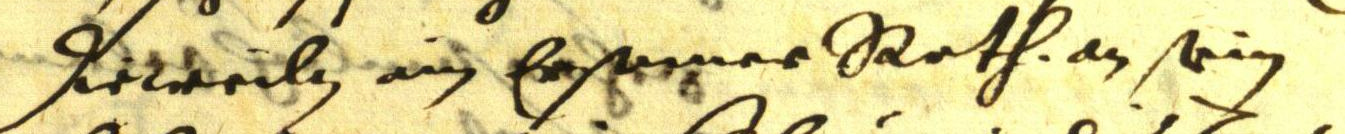Derweiln ain Ersamer Rath. an sein
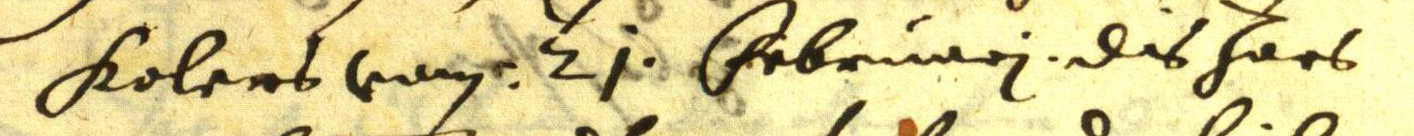Kolers vom: 21. Febrūarj. dis Jars
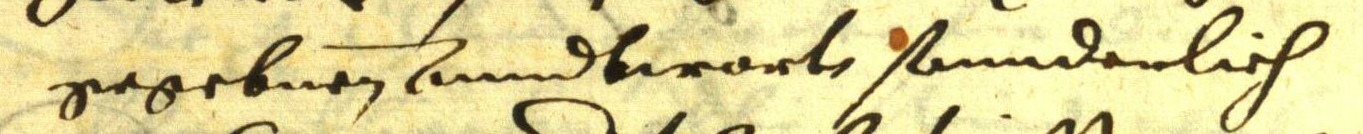gegebnen Anndtwort, sonnderlich
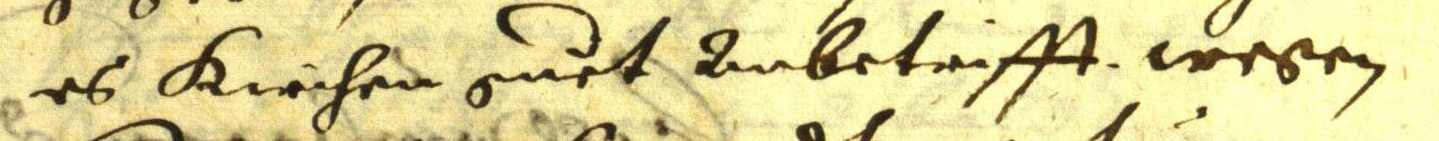es Kirchen gūet Anbetrifft. wegen
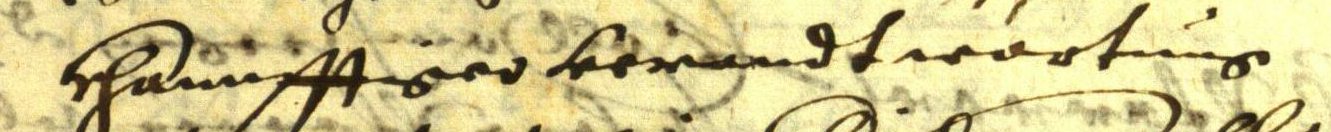khonnfftiger verandtwortūng
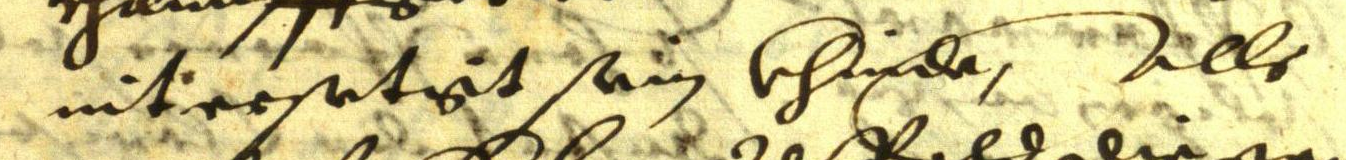nit ersetigt sein khinde, Alls
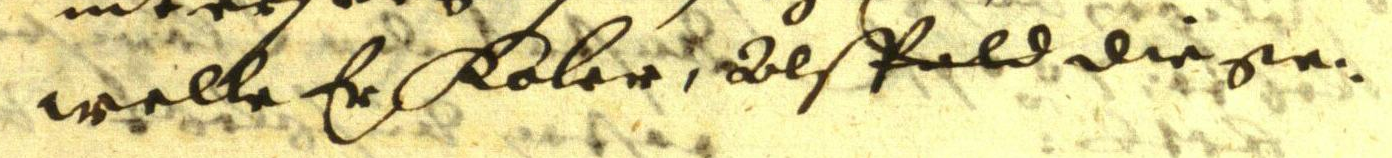welle Er Koler, Alspald die ge¬
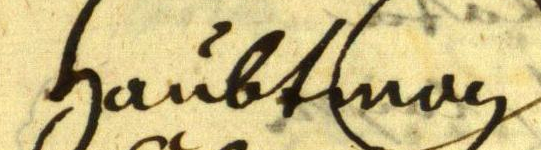Haūbtman
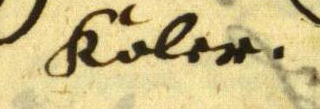Koler.
